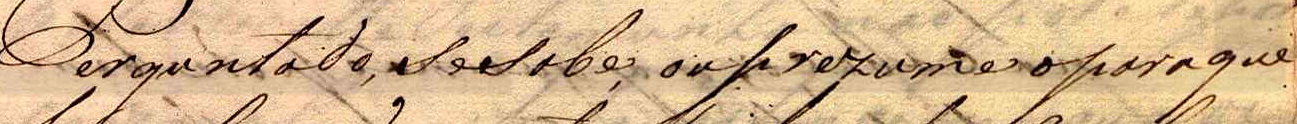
Perguntado, se sabe, ou prezume o para que
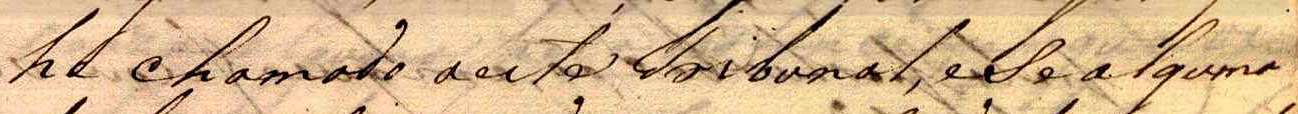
he chamado a este Tribunal, e se alguma
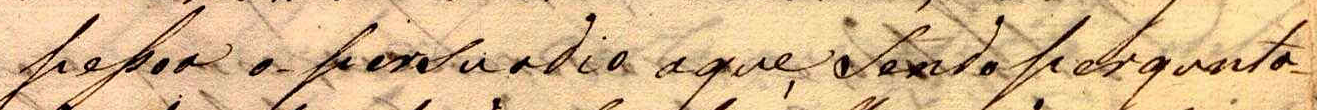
pessoa o persuadio a que sendo pergunta
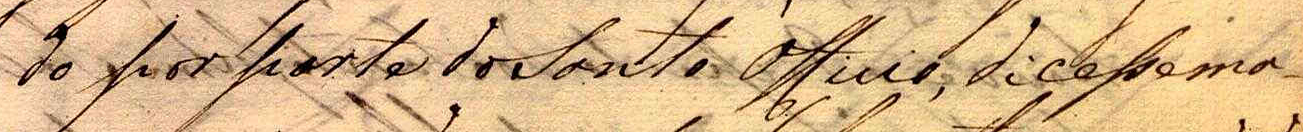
do por parte do Santo Officio, diçesse ma
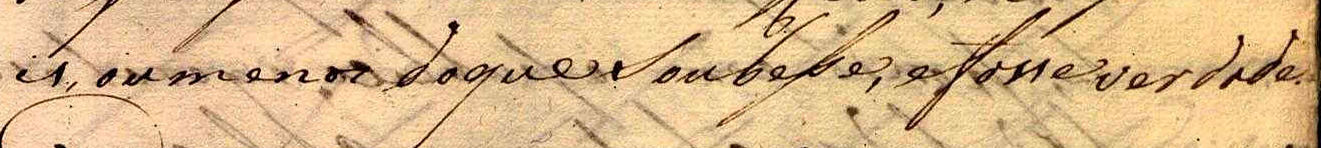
is, ou menos do que soubesse, e fosse verdade
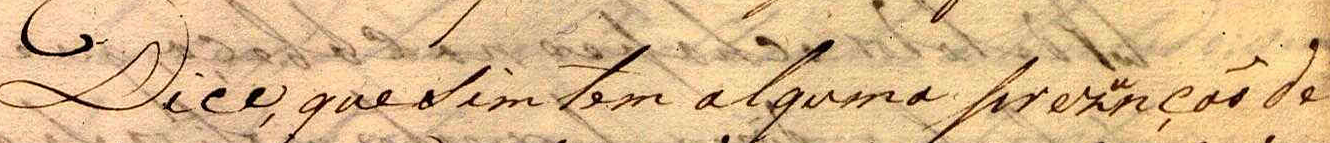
Dice, que sim tem alguma prezunçaõ de
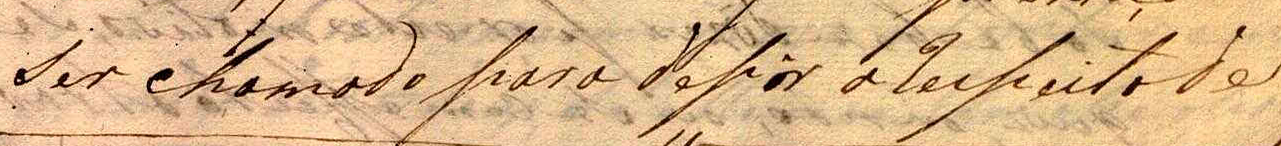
ser chamado para depôr a Respeito de
